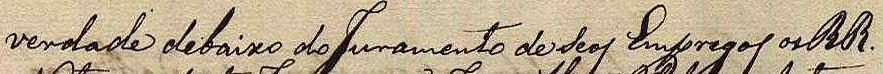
verdade debaixo do Juramento de seos Empregos os RR.
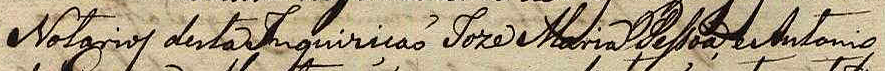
Notarios desta Inquiziçaõ Ioze Maria Pessoa, e Antonio
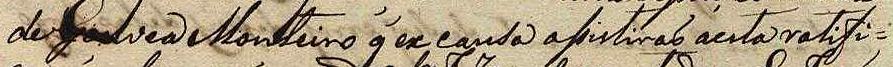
de Gouvea Monteiro q̄ ex causa assistiraõ a esta ratifi
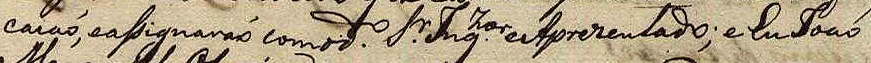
caçaõ, e assignaraõ com o d.o S.r Inq.zor e Aprezentado; e Eu Ioaõ
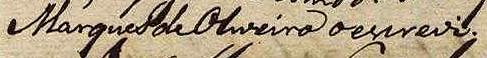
Marques de Oliveira o escrevi.
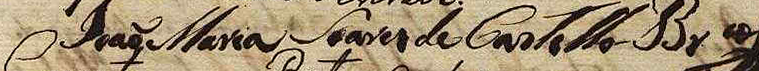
Ioaõ Maria Soares de Castello Br.co
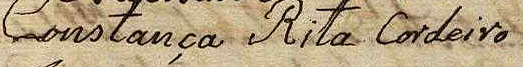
Constança Rita Cordeiro
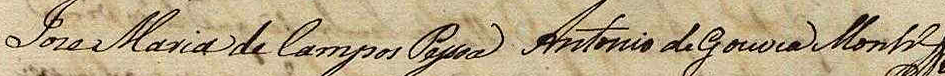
Ioze Maria de Campos Pessoa Antonio de Gouvea Montr
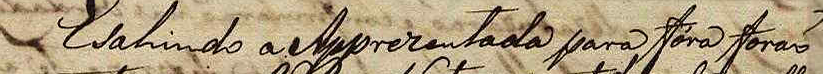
E sahindo a Apprezentada para fóra foraõ
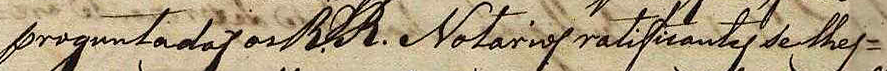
proguntados os R.R. Notarios ratificantes se lhes
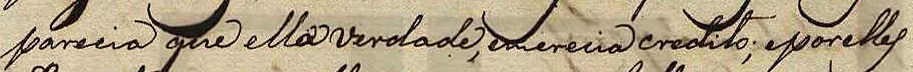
parecia que ella verdade, merecia credito; e por elles
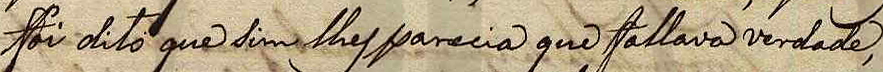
foi dito que sim lhes parecia que fallava verdade,
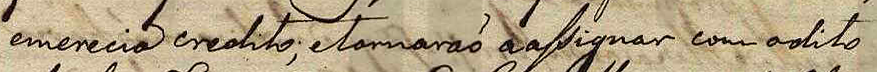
e merecia credito; e tornaraõ a assignar com o dito
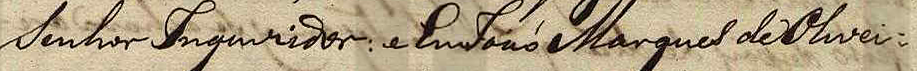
Senhor Inquizidor: e Eu Ioaõ Marques de Olivei
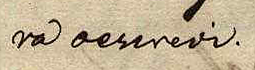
ra o escrevi.
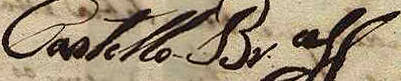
Castello Br.co
